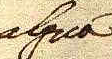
alguā
